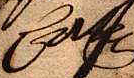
Cortez
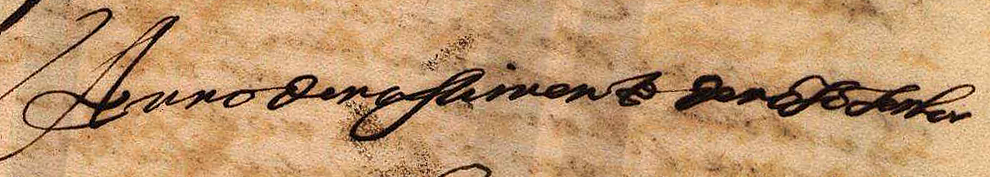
Anno do nascimento de noso senhor
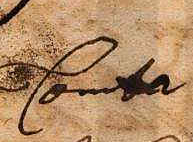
Comta
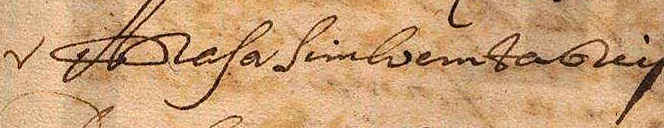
item A Rasa simCoemta Reis
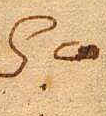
50
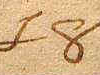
18
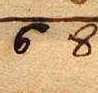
68
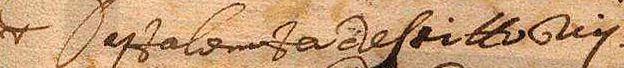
item Desta Comta desoitto Reis
